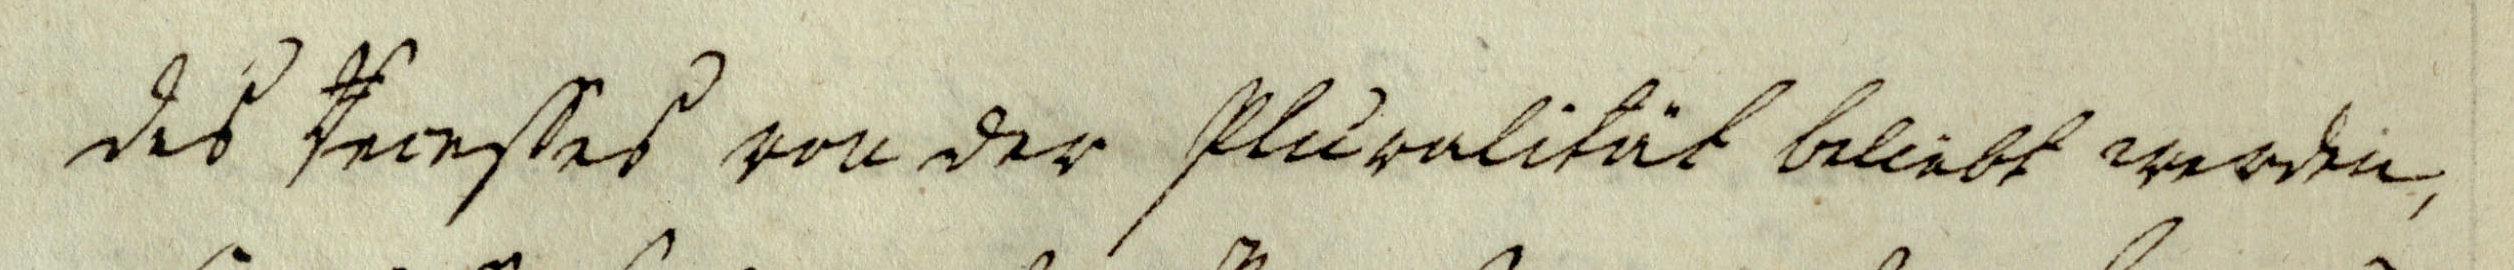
des Recesses von der Pluralität beliebt werden,
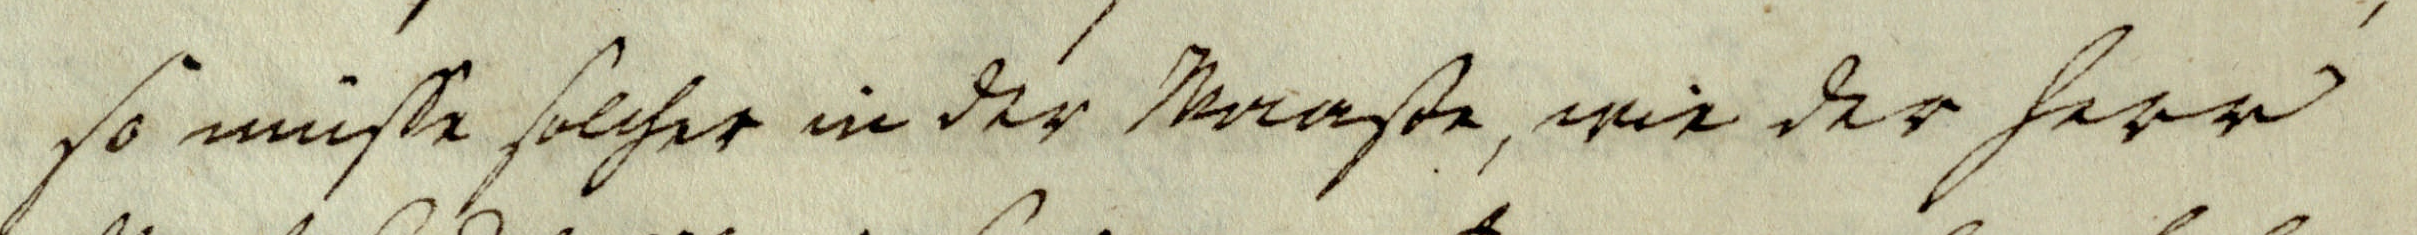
so müsse solcher in der Maaße, wie der Herr
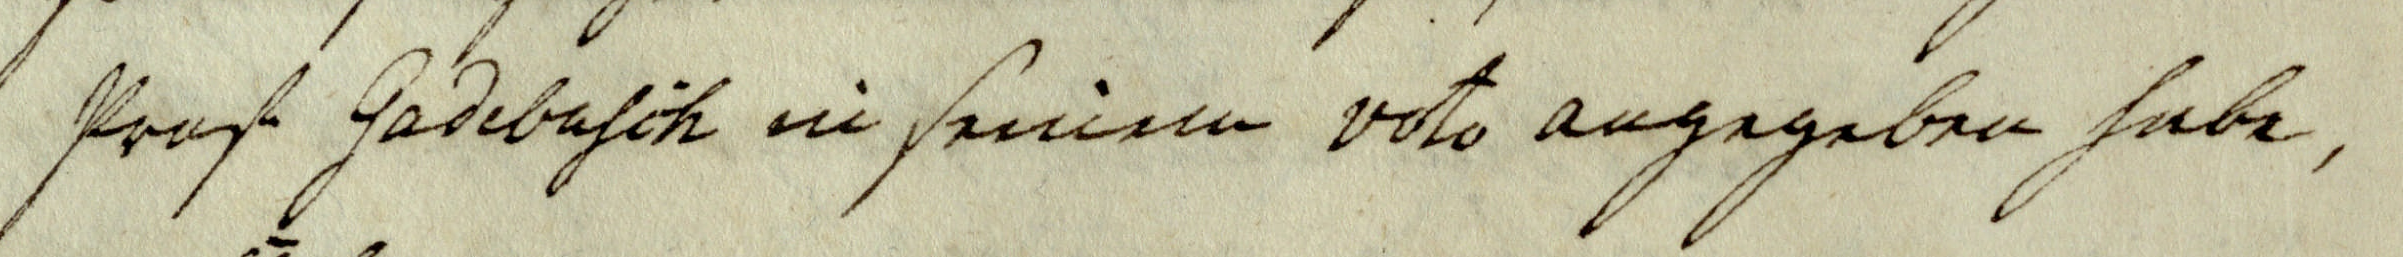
Prof. Gadebusch in seinem voto angegeben habe,
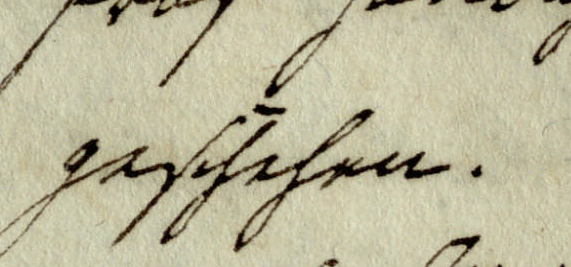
geschehen.
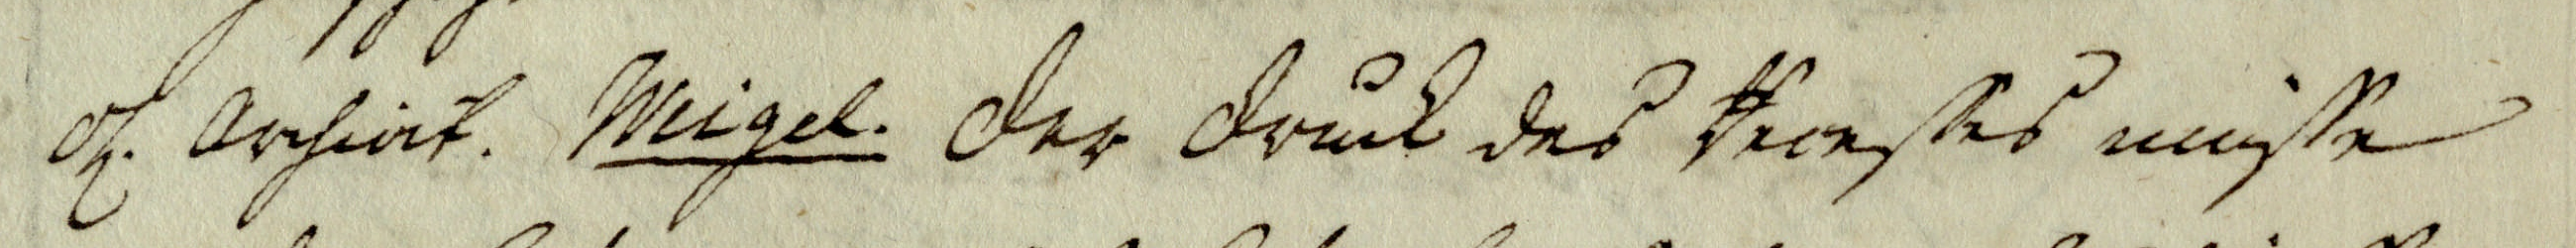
dh. Archiat. Weigel. Der Druck des Recesses müsse
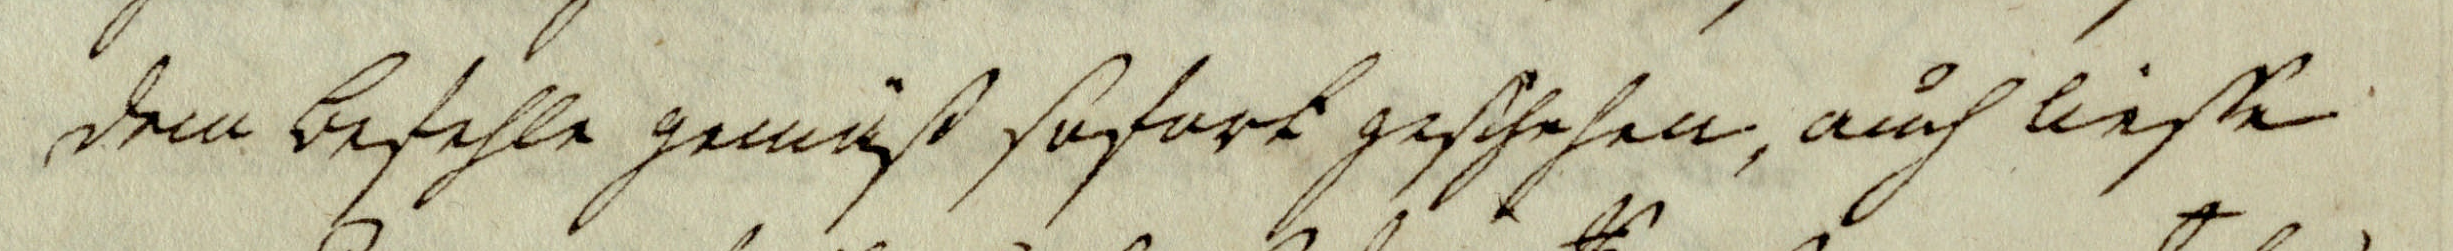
dem Befehle gemäß sofort geschehen, auch liesse
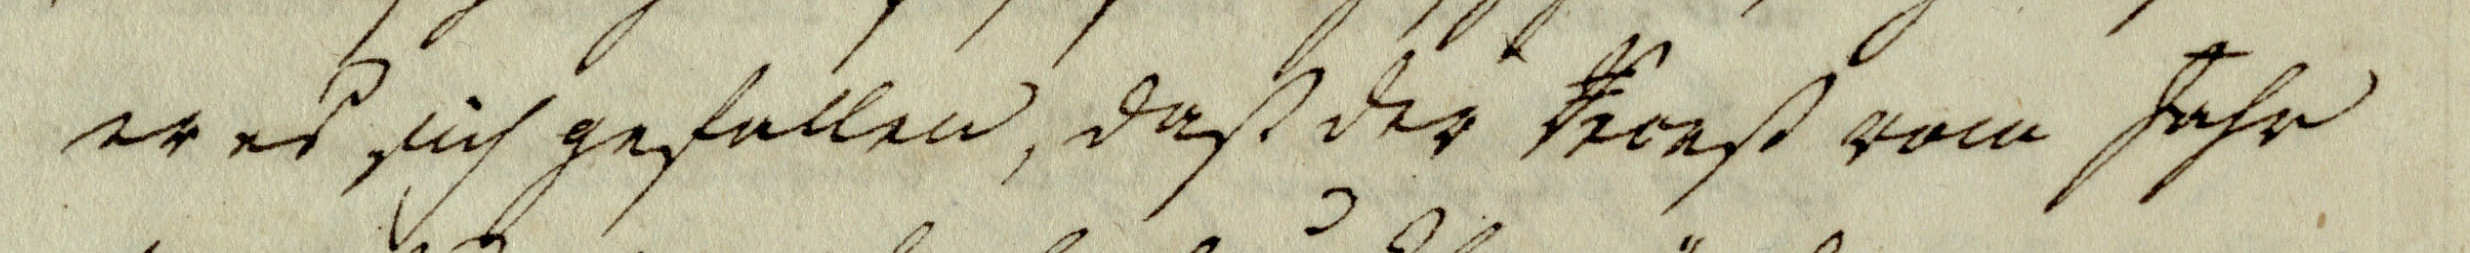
er es sich gefallen, daß der Receß vom Jahr
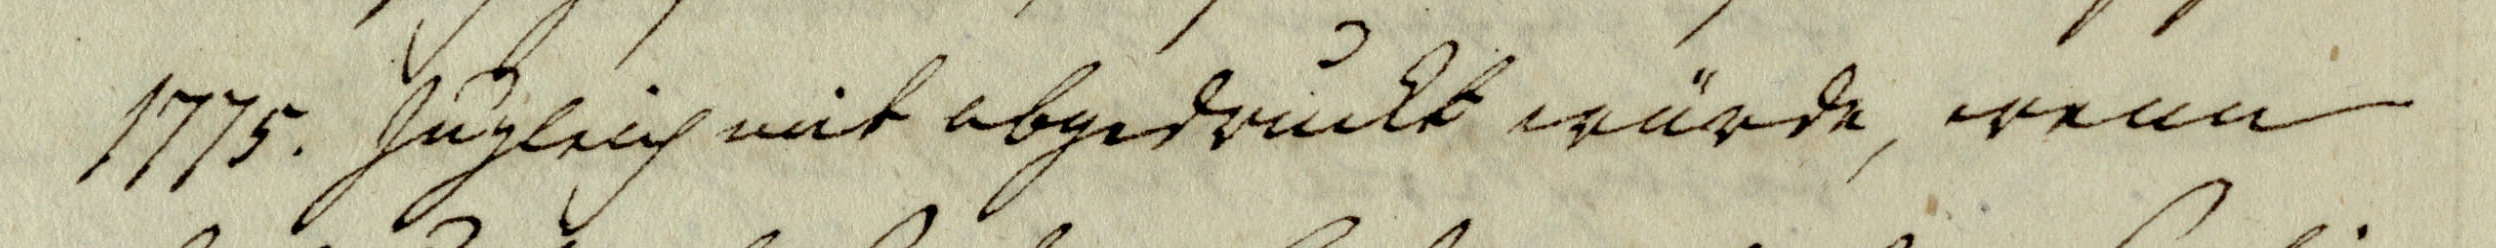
1775. zugleich mit abgedruckt würde, wenn
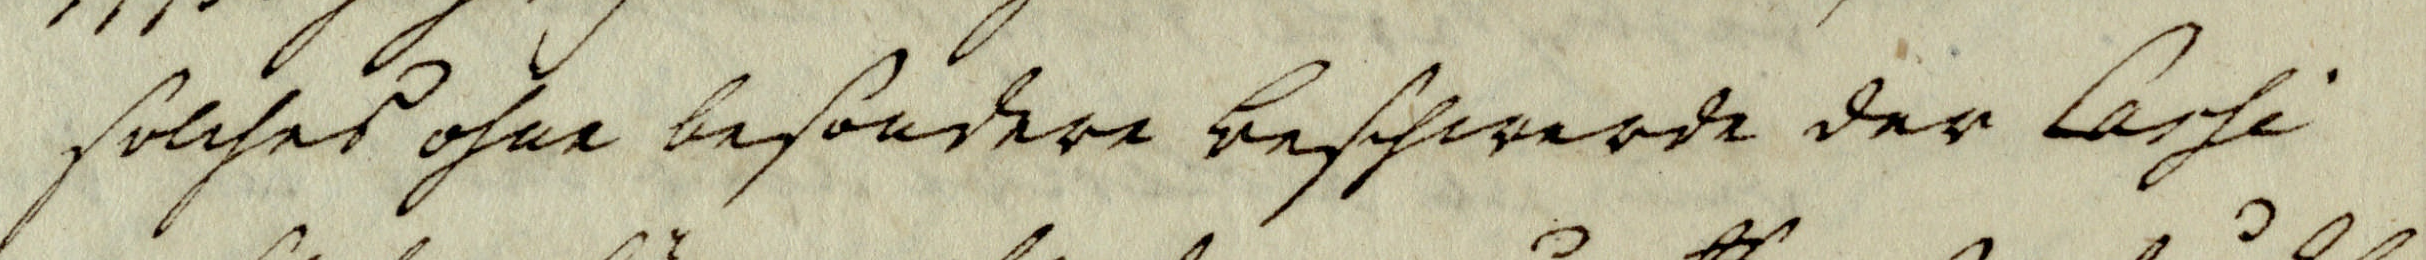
solches ohne besondere Beschwerde der Cassi
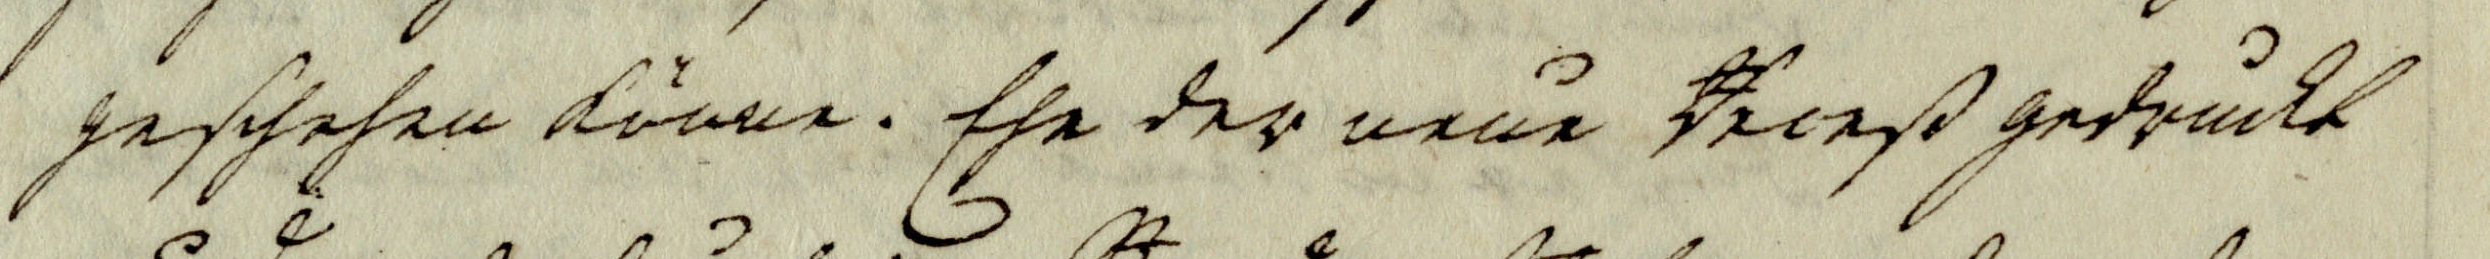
geschehen könne. Ehe der neue Receß gedruckt
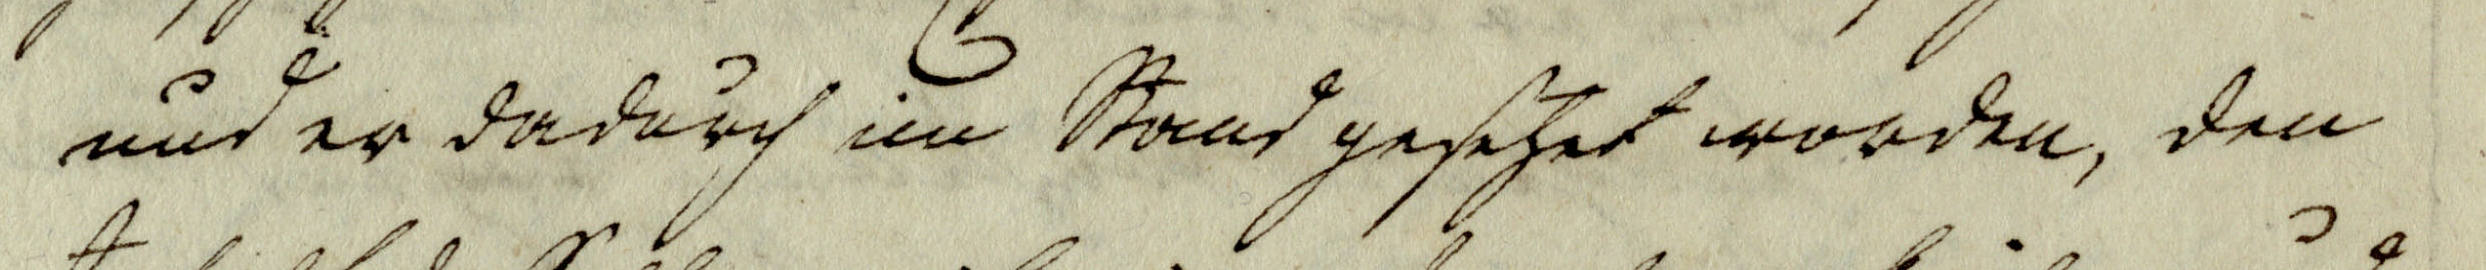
und er dadurch im Stand gesetzet worden, den
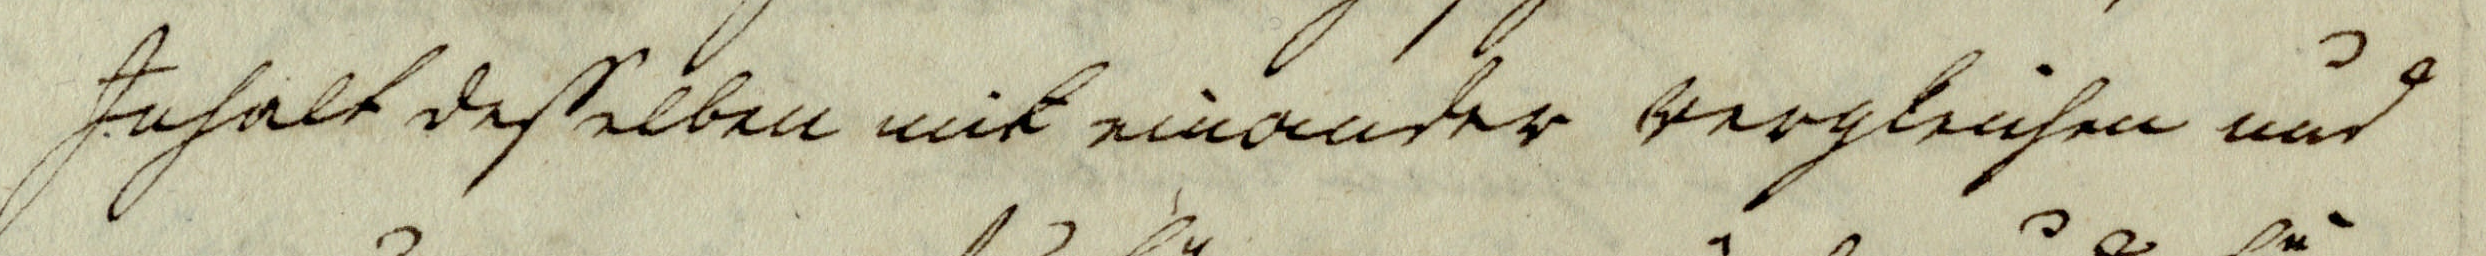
Inhalt desselben mit einander vergleichen und
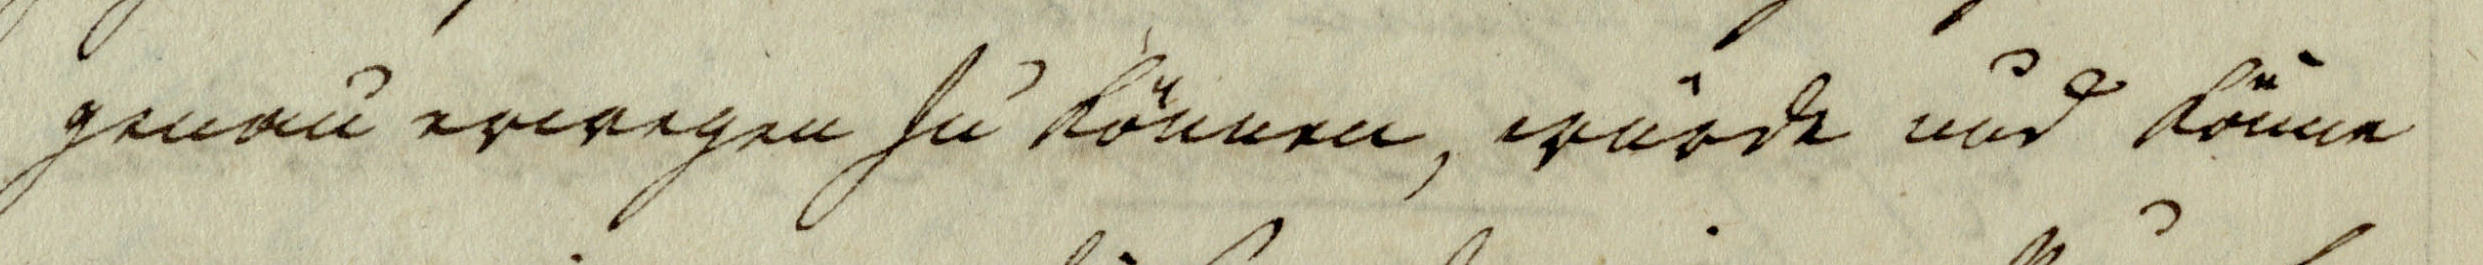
genau erwegen zu können, würde und könne
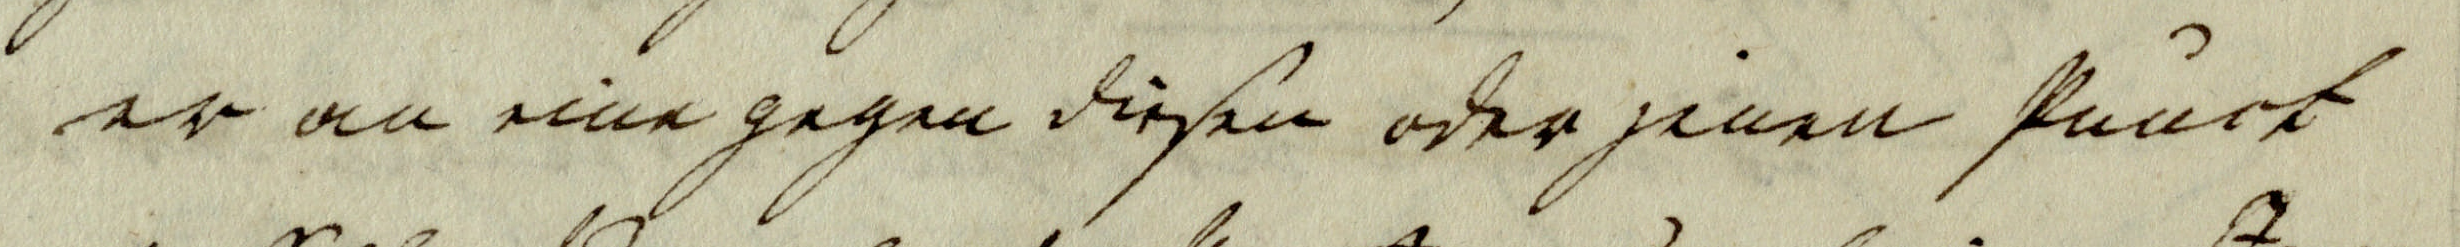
er an eine gegen diesen oder jenen Punct
